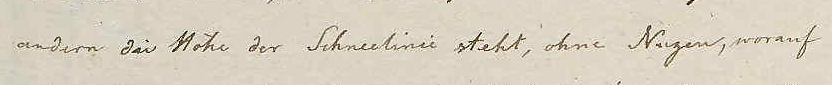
andern die Höhe der Schneelinie steht, ohne Nuzen, worauf
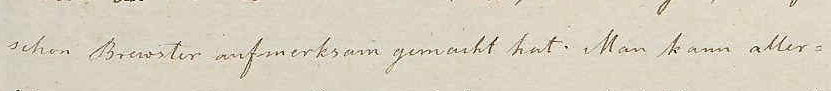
schon Brewster aufmerksam gemacht hat. Man kann aller-
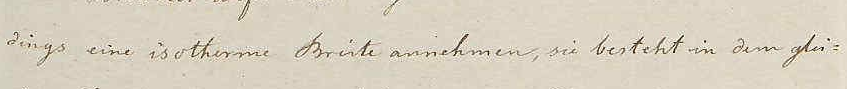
dings eine isotherme Breite annehmen, sie besteht in dem glei-
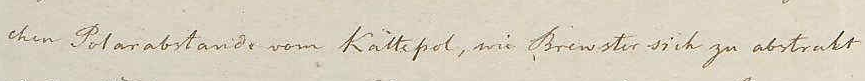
chen Polarabstande vom Kältepol, wie Brewster sich zu abstrakt
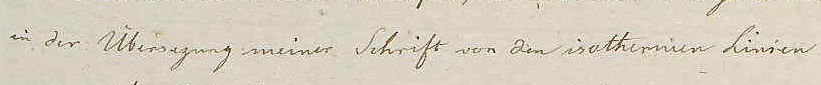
in der Übersezung meiner Schrift von den isothermen Linien
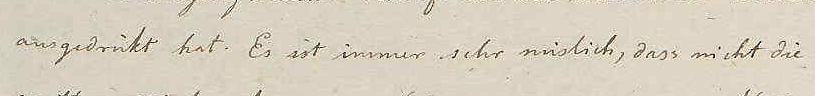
ausgedrükt hat. Es ist immer sehr mislich, dass nicht die
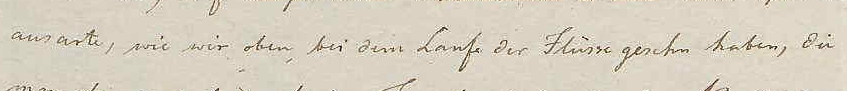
ausarte, wie wir oben bei dem Laufe der Flüsse gesehn haben, die
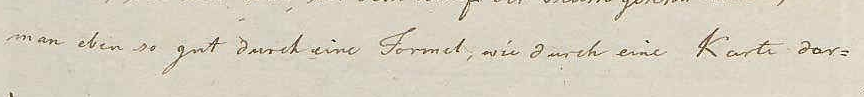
man eben so gut durch eine Formel, wie durch eine Karte
